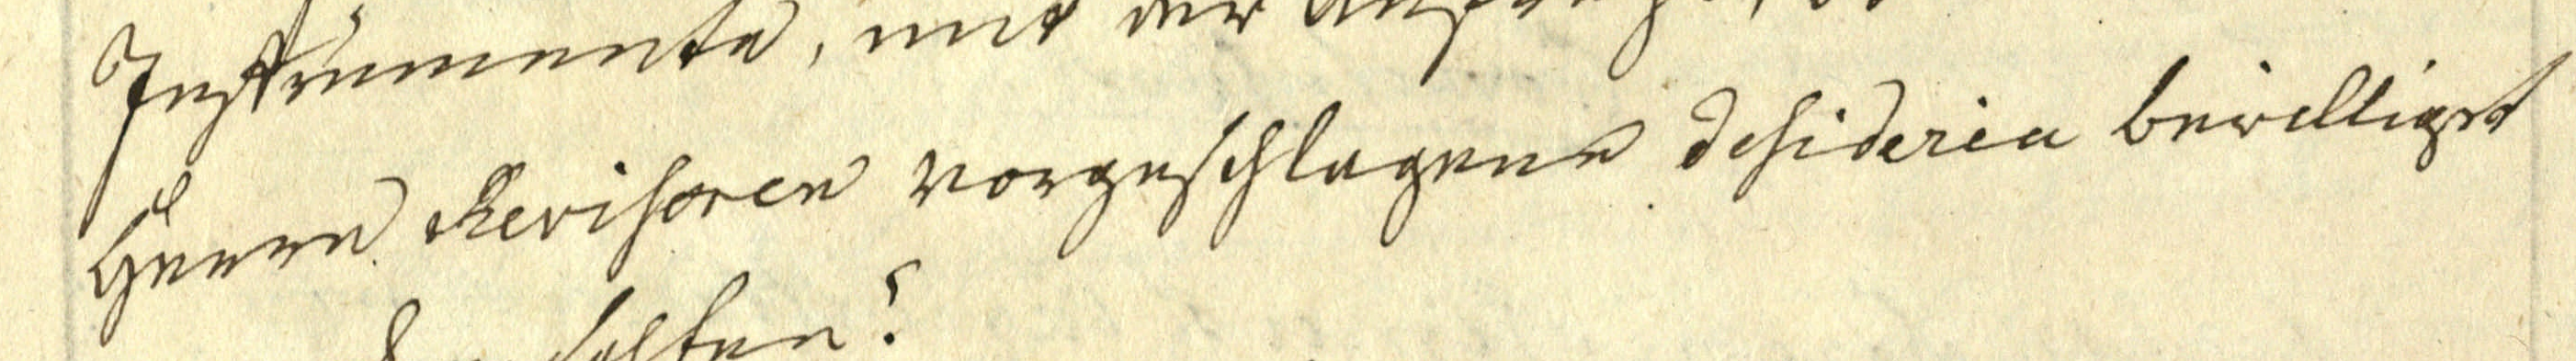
Herrn Revisoren vorgeschlagene desideria bewilliget
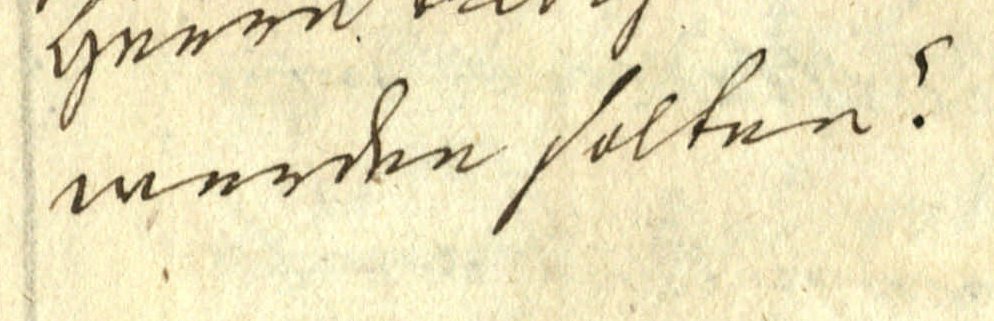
werden solten?
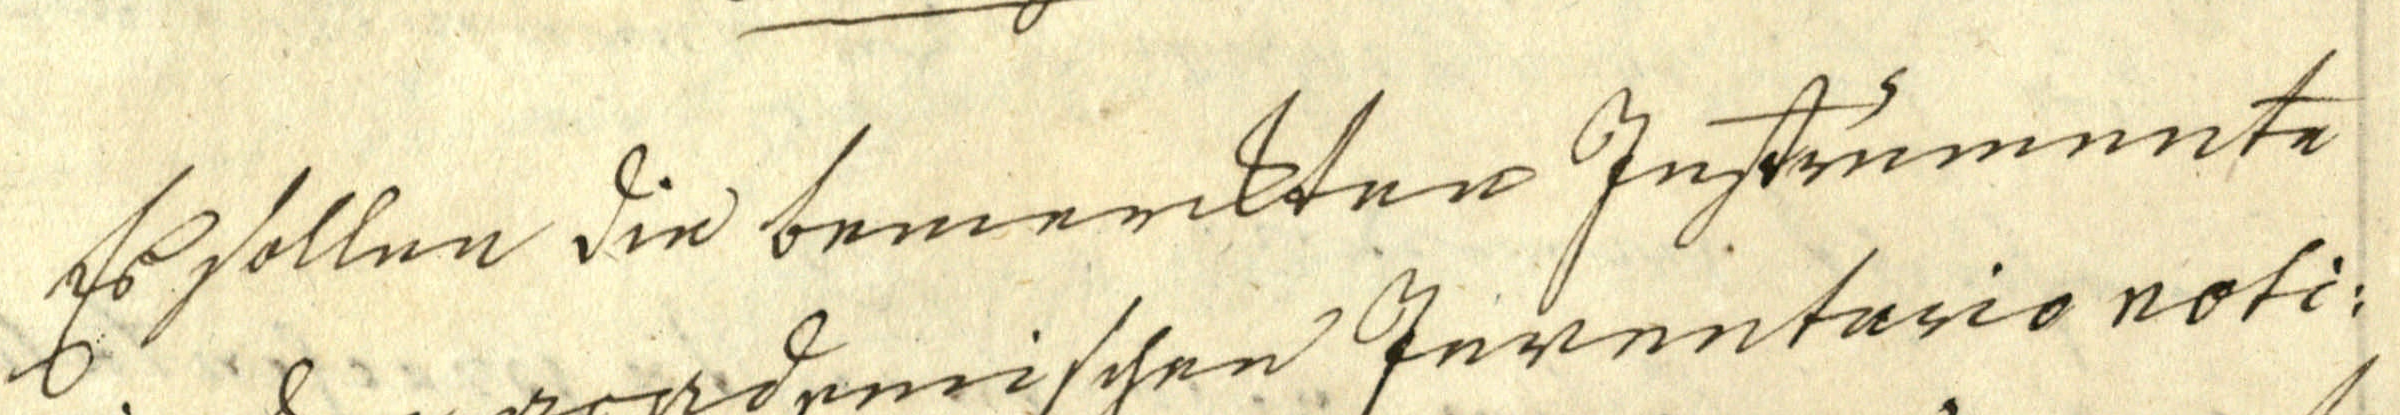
Es sollen die bemerckten Instrumente
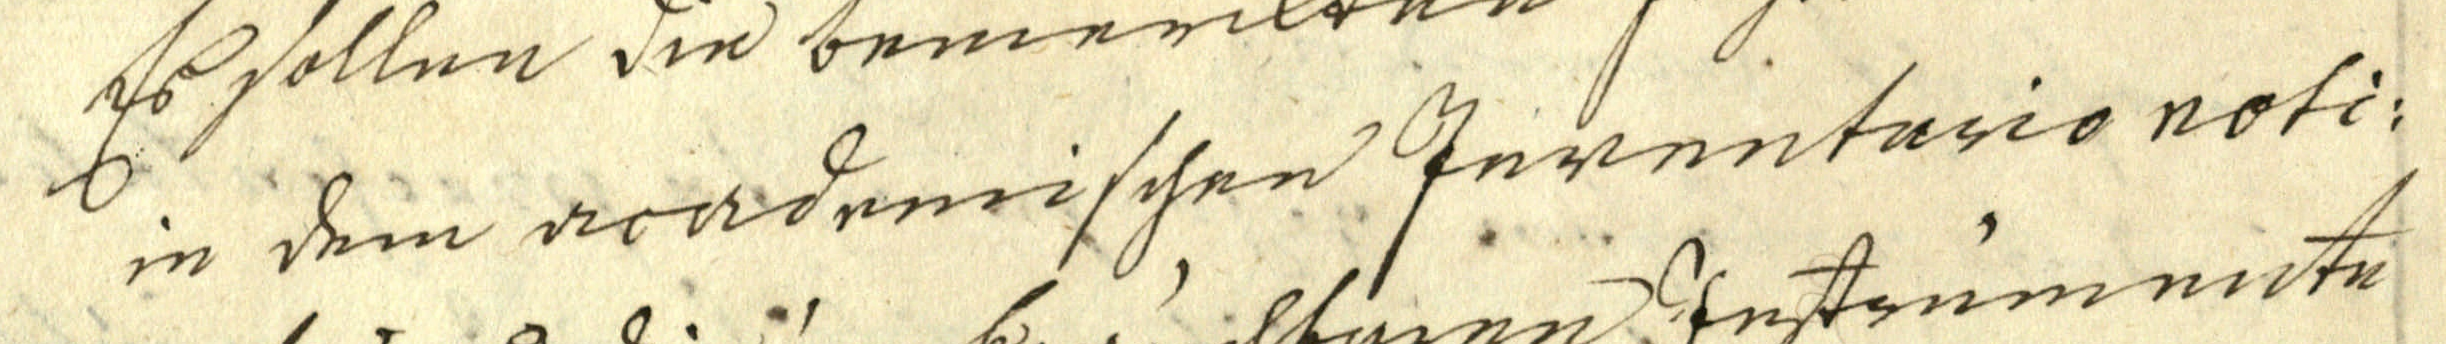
in dem academischen Inventario noti¬
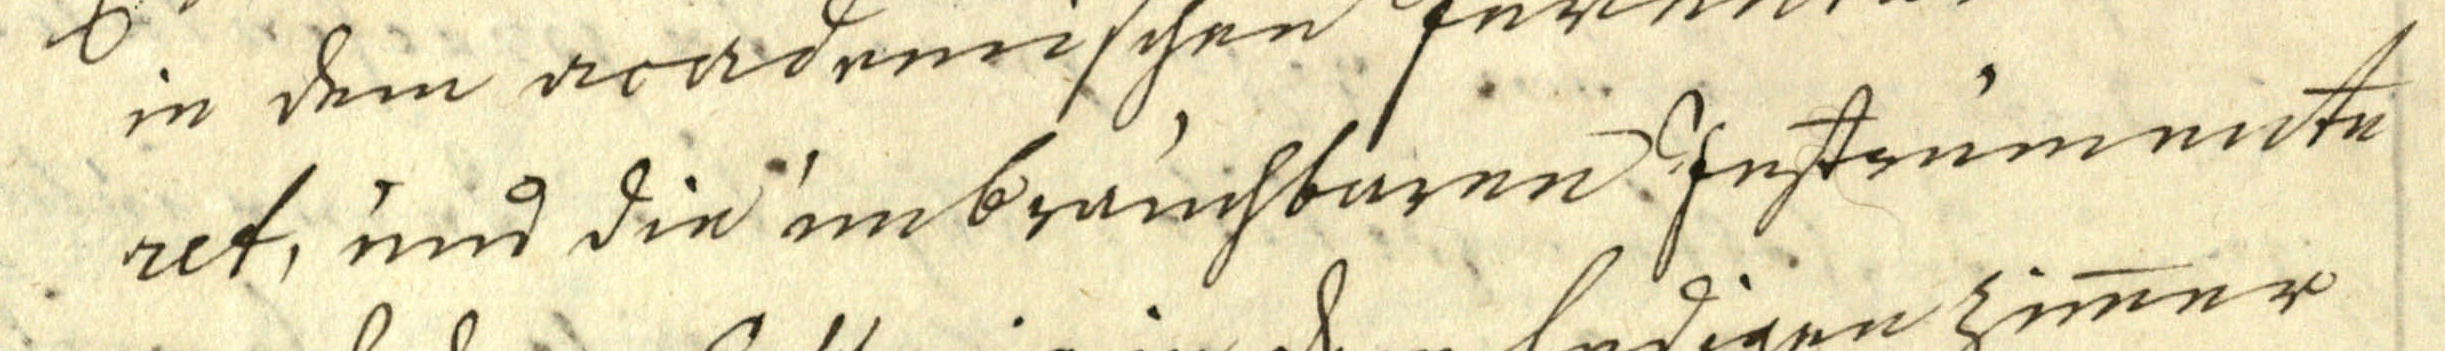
ret, und die unbrauchbaren Instrumente
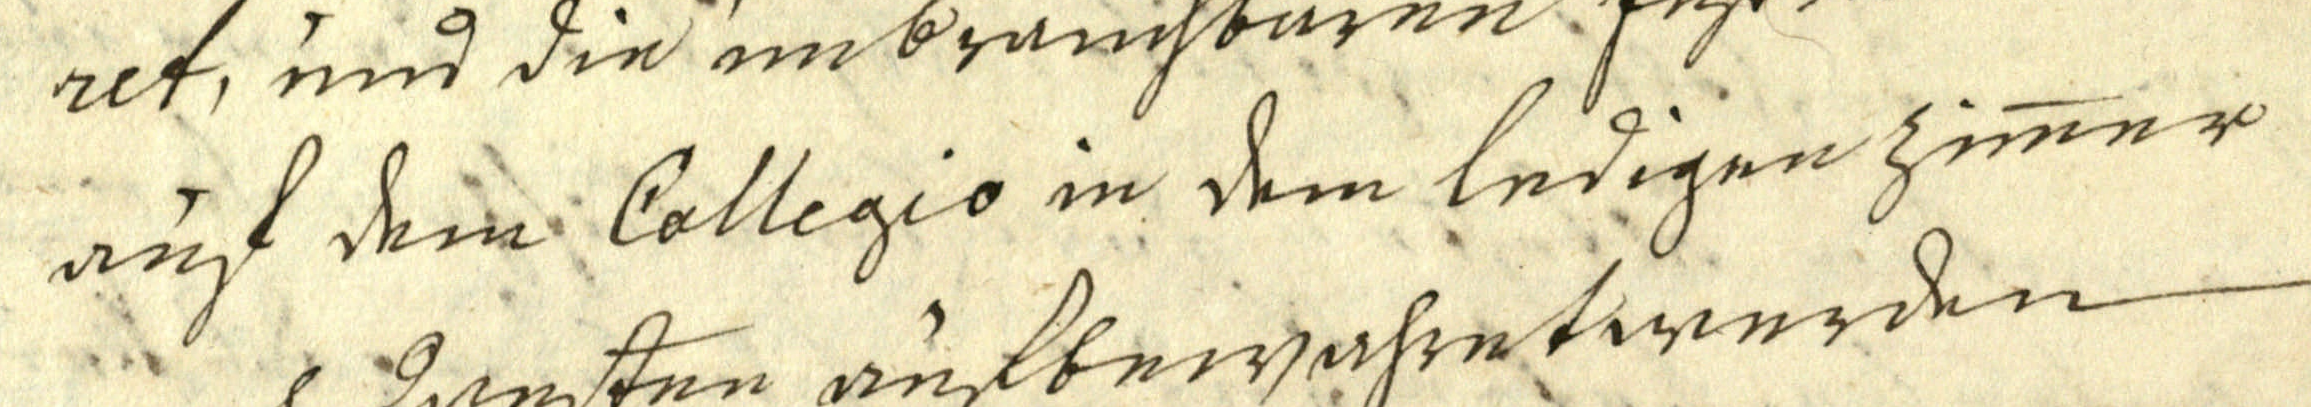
auf dem Collegio in dem ledigen Zimer
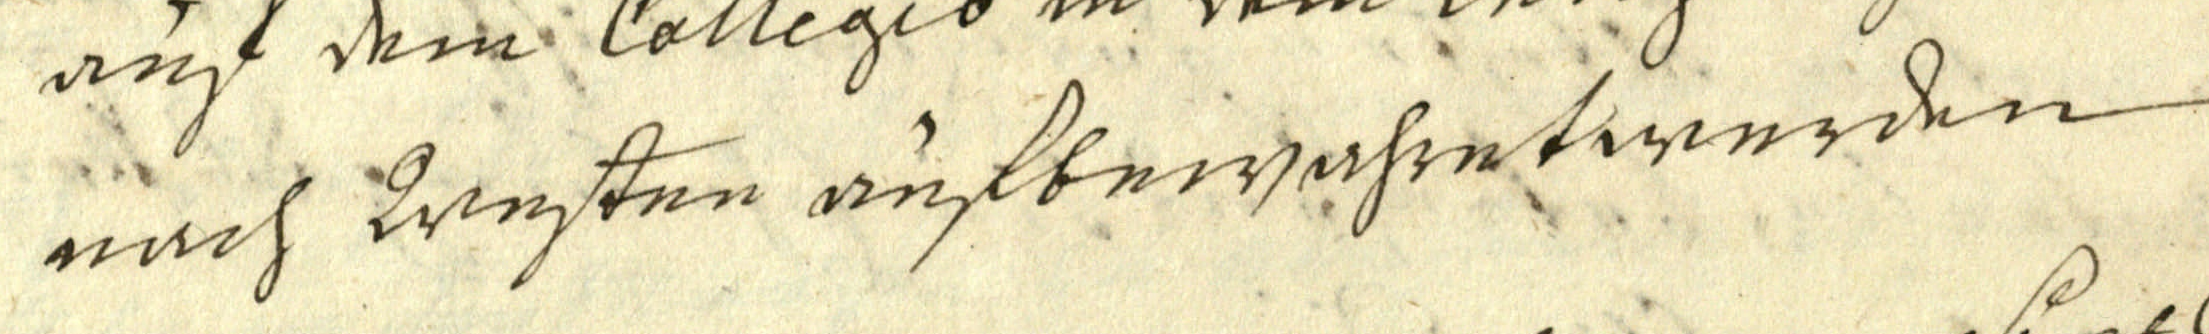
nach Westen aufbewahret werden.
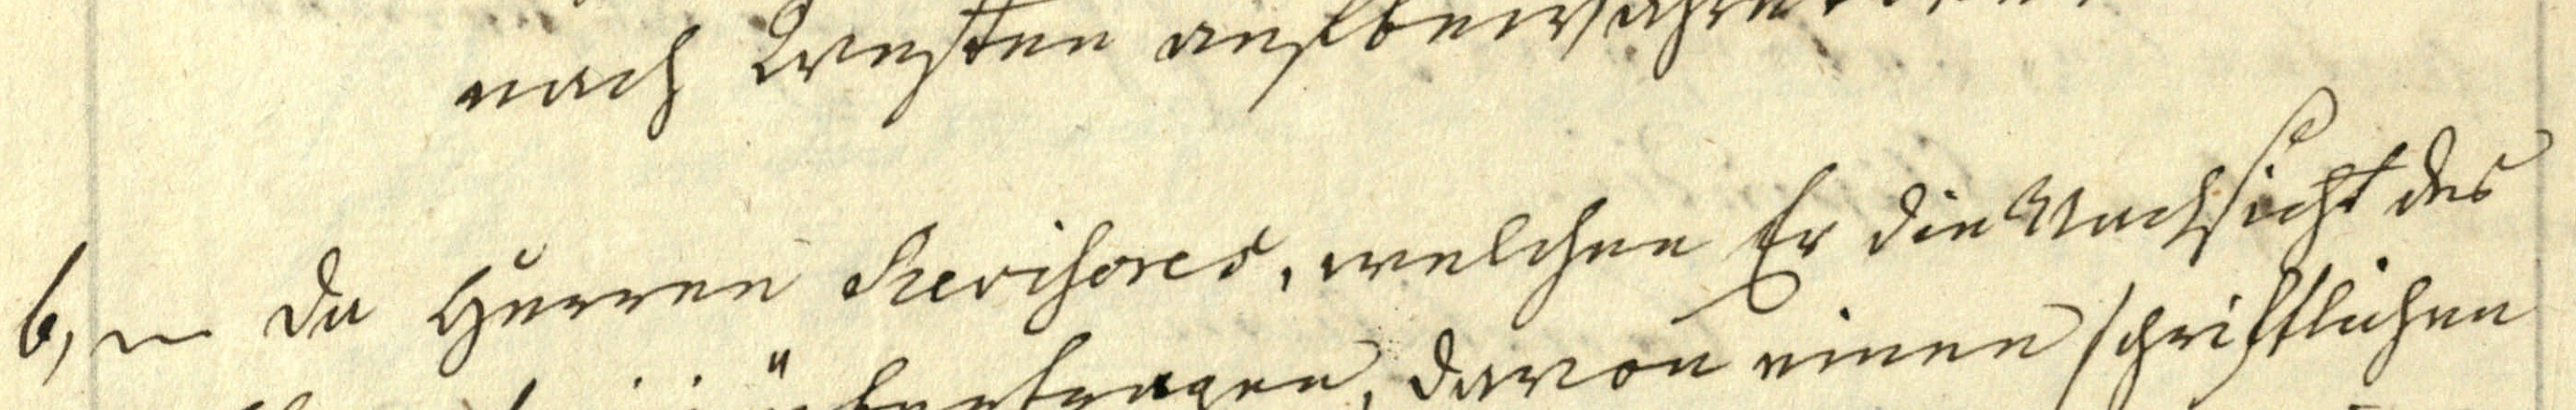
6, Da Herren Revisores, welchen Er die Nachsicht des
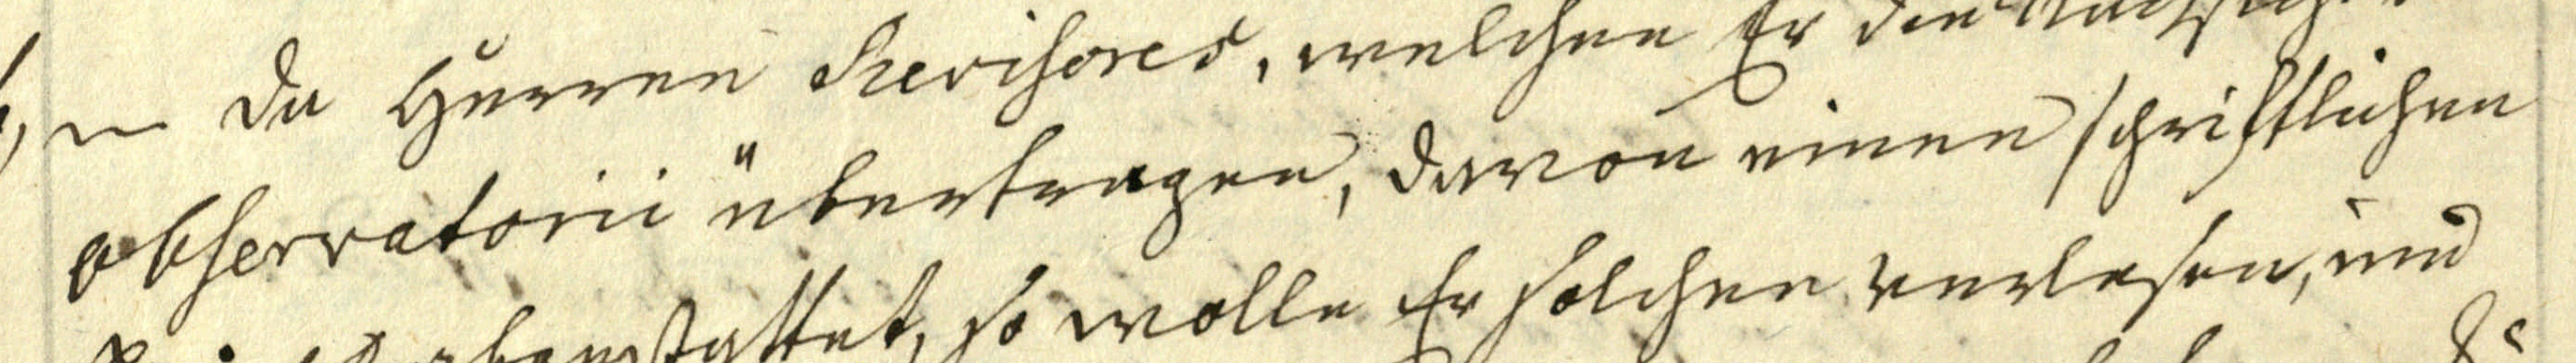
Observatorii übertragen, davon einen schriftlichen
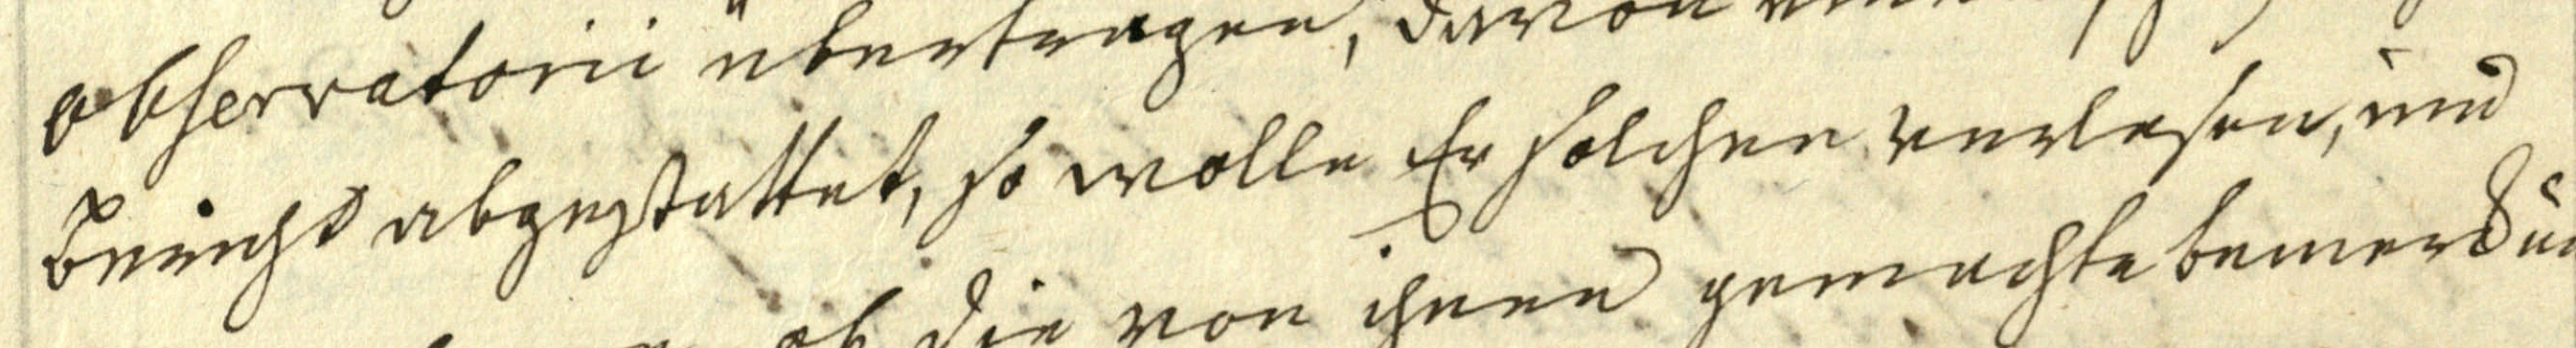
Bericht abgestattet, so wolle Er solchen verlesen, und
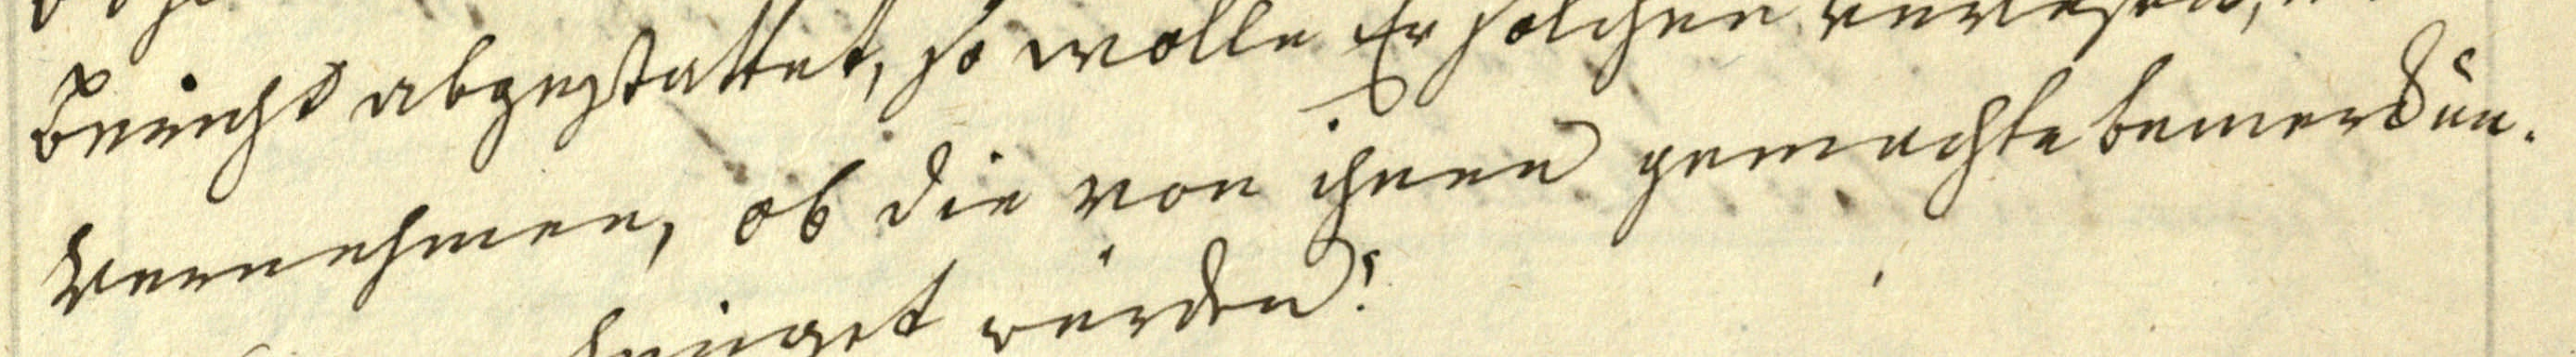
vernehmen, ob die von ihnen gemachte Bemerkun¬
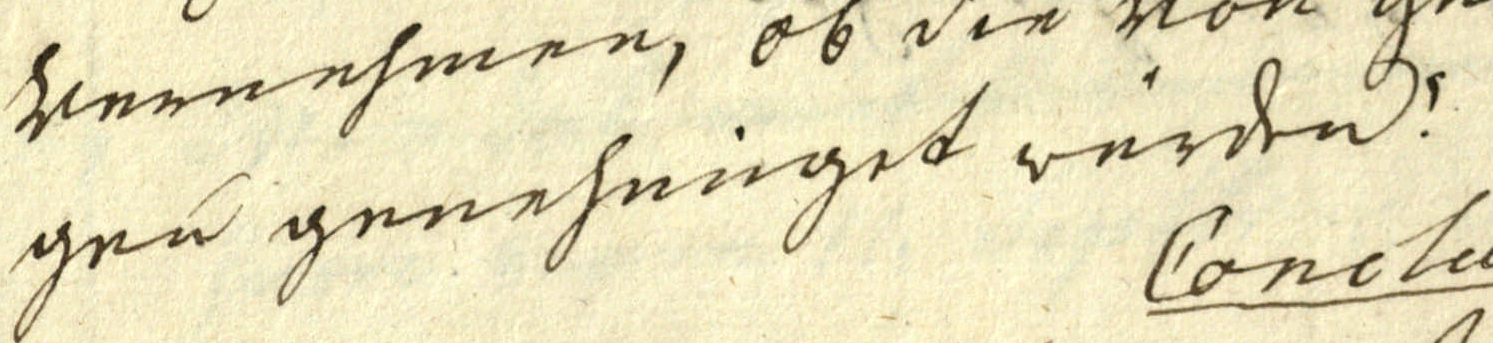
gen genehmiget würden?
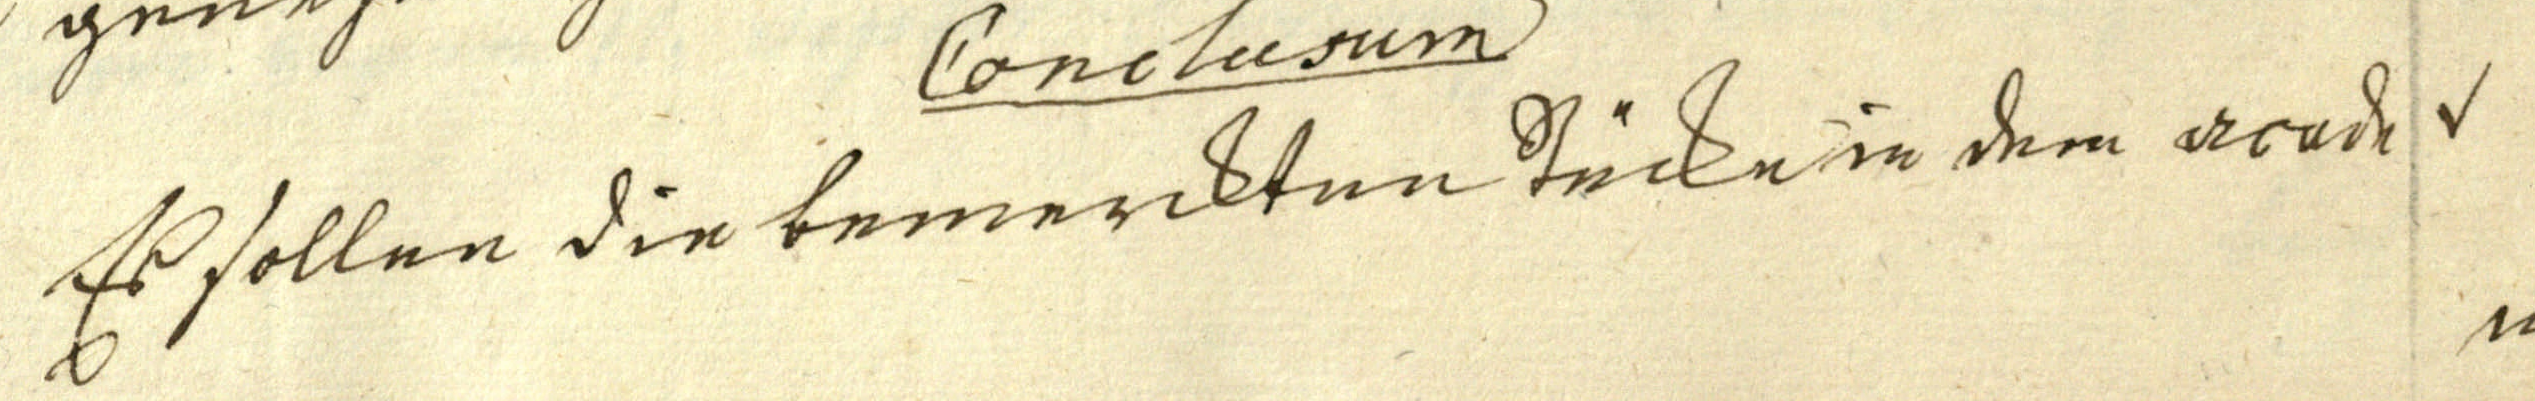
Es sollen die bemerckten Stücke in dem Acade
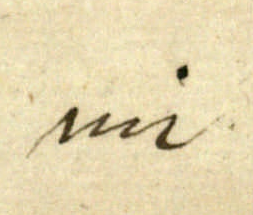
mi
